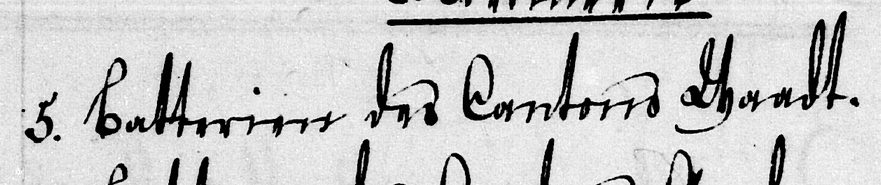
5. Batterien des Cantons Waadt.
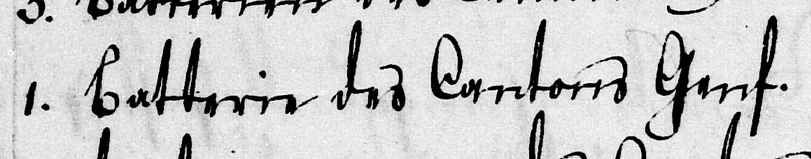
1. Batterie des Cantons Genf.
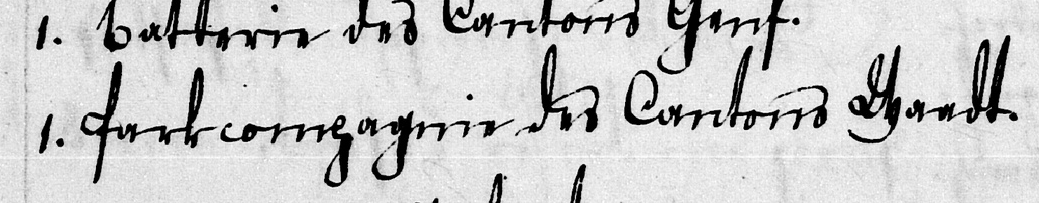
1. Parkcompagnie des Cantons Waadt.
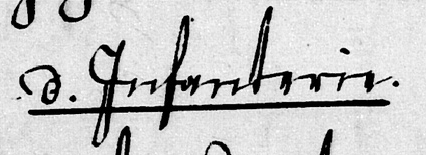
d. Infanterie.
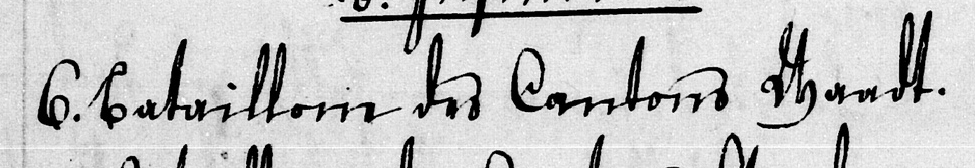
6. Bataillone des Cantons Waadt.
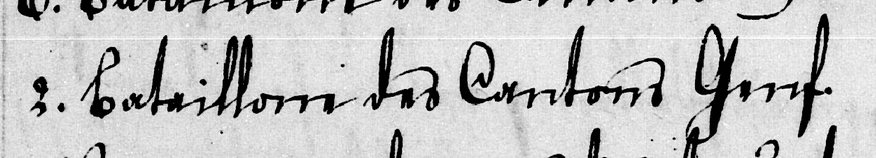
2. Bataillone des Cantons Genf.
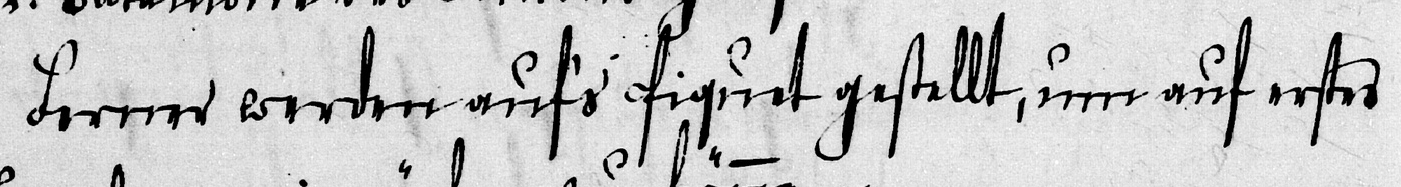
Ferner werden auf’s Piquet gestellt, um auf erstes
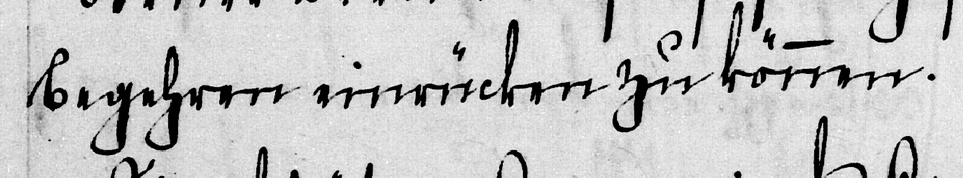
Begehren einrücken zu können.
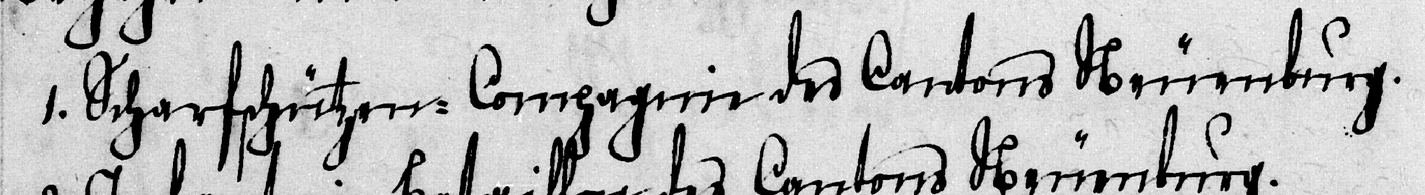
1. Scharfschützen-Compagnie des Cantons Neuenburg.
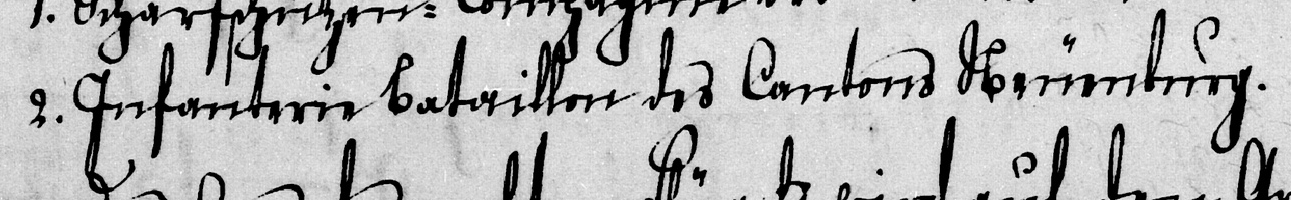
2. Infanterie Bataillon des Cantons Neuenburg.
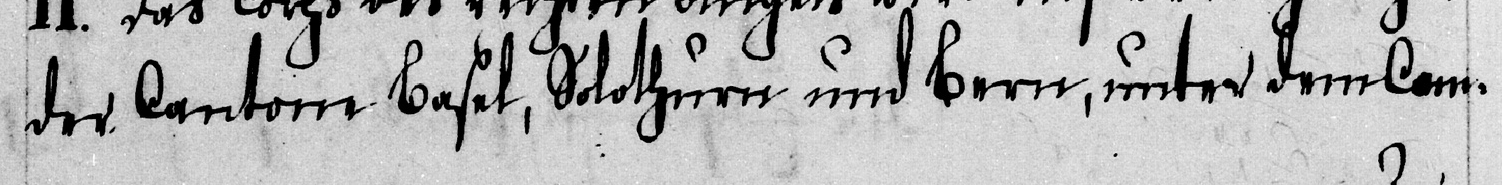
der Cantone Basel, Solothurn und Bern, unter dem Com-
